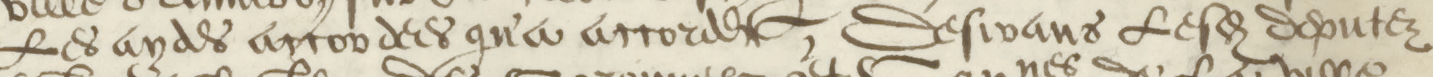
les aydes accordees qu‛a accorder, Desirans lesd deputez
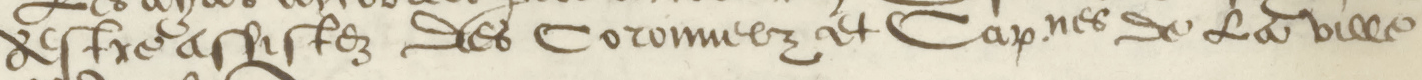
d'estre assistez des Coronnelz et Capnes. de la ville
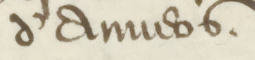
d'Anuers.
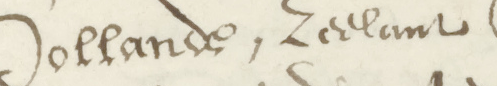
Hollande, Zeelant
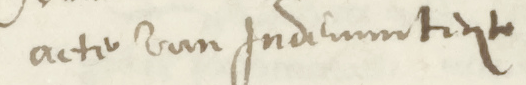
acte van Indemniteyt
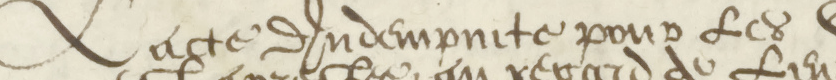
L‛acte dIndempnite pour les Estatz d‛hollande et zelande
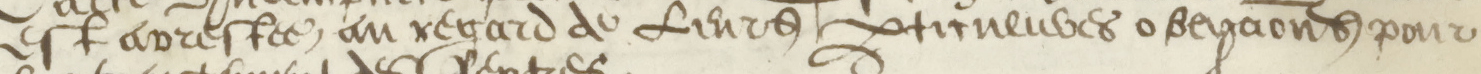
est arrestee, au regard de leurs pticulieres obligaons pour
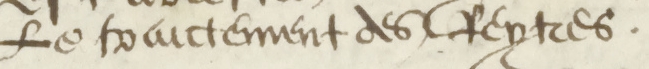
le traictement des Reytres.
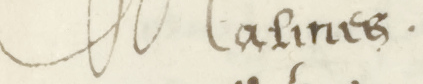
Malines.
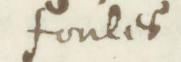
Foules
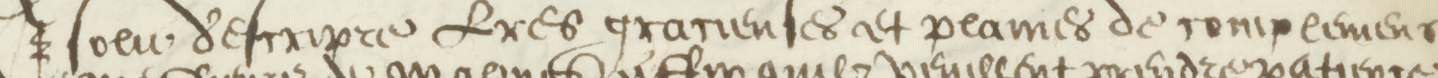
Resolu descripre lres gracieuses et plaines de complemens
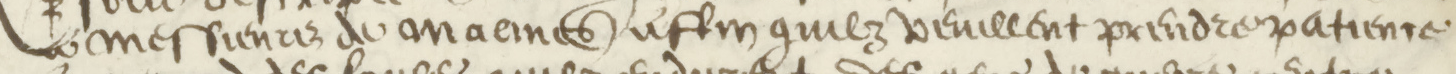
a messieurs de Malines affin quilz veullent prendre patience
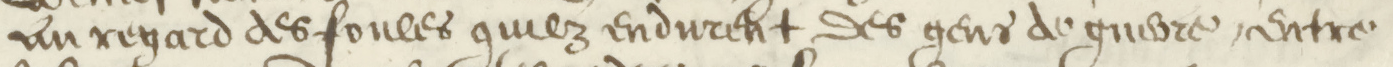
au regard des foules quilz endurent des gens de guerre, entre
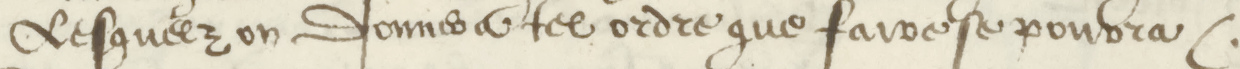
lesquelz on donner a tel ordre que faire se pouvra
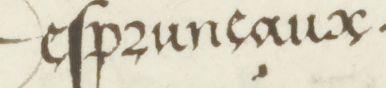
Despruneaux.
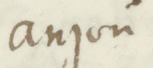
Anjou.
